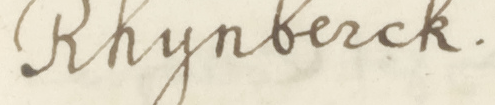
Rhijnberck.
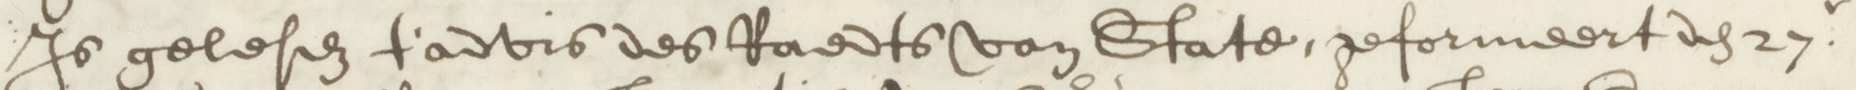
Is gelesen t'advis des Raedts van State, geformeert den 27e.
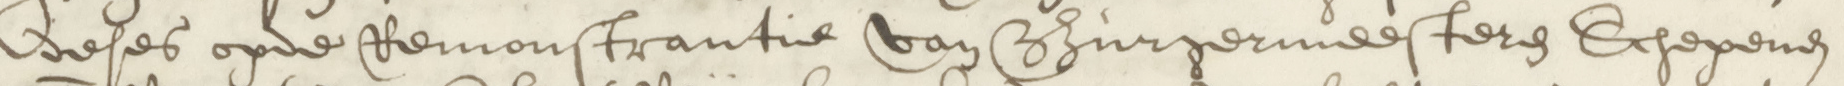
deses opde Remonstrantie van Burgermeesteren Schepenen
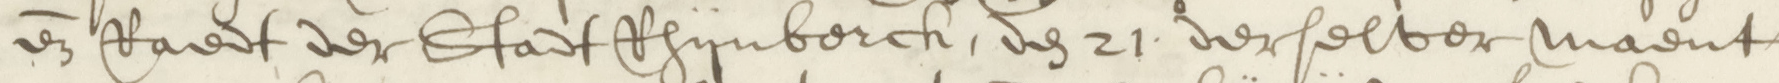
en Raedt der Stadt Rhijnberck, den 21. derselver maent
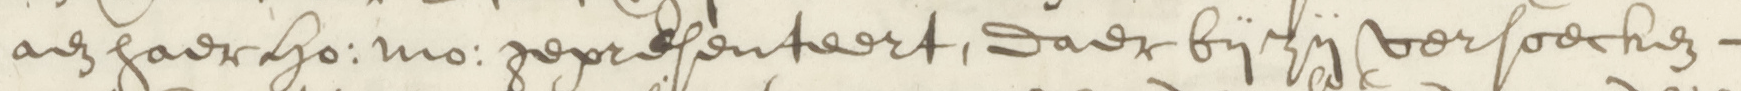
aen haer Ho:Mo: gepresenteert, daer bij zij versoecken
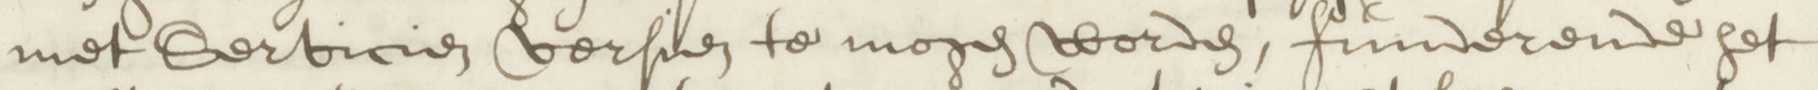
met Servicien versien te mogen worden, funderende het
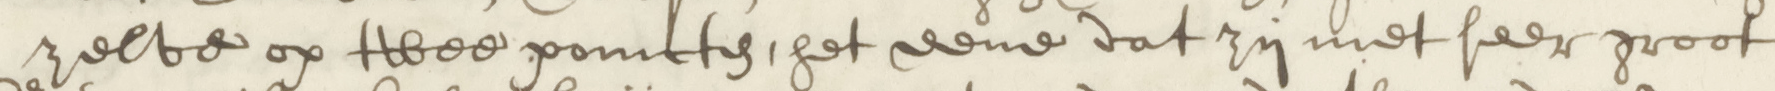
zelve op twee poincten, het eene dat zij met seer groot
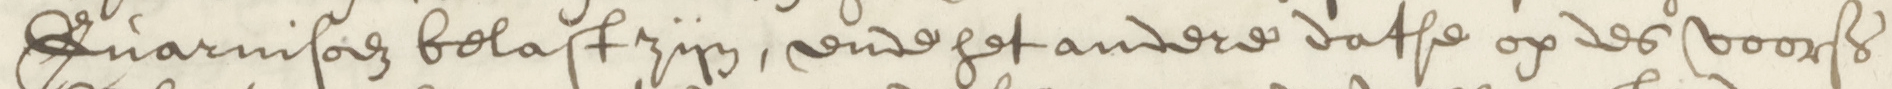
Guarnisoen belast zijn, ende het andere datse op des voors
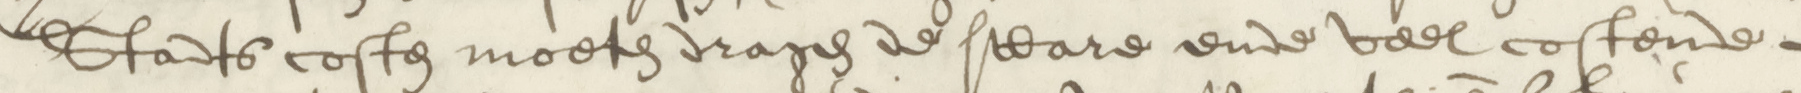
Stadts costen moeten dragen de sware ende veel costende
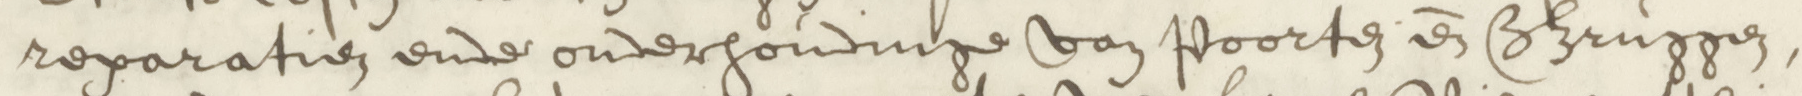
reparatien ende onderhoudinge van Poorten en Bruggen,
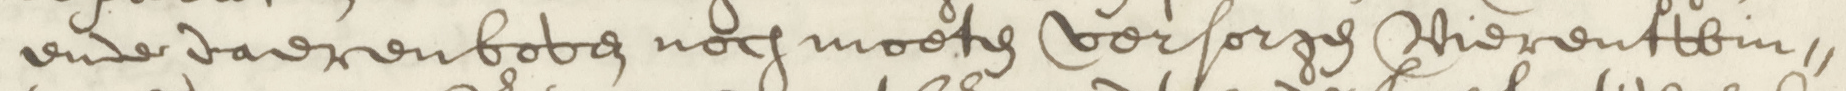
ende daerenboven noch moeten versorgen Vierentwin„
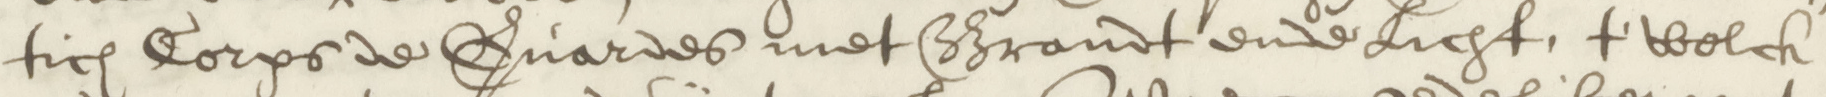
tich Corps de Guardes met Brandt ende Licht, t'welck
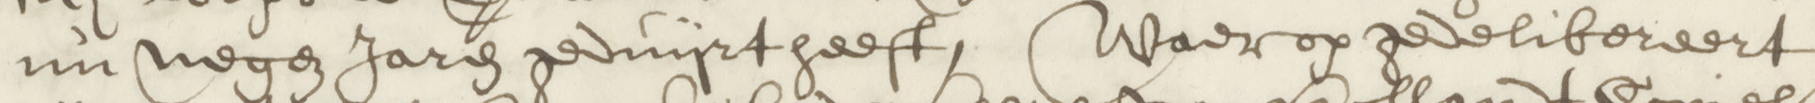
nu negen Jaren geduijrt heeft. Waerop gedelibereert
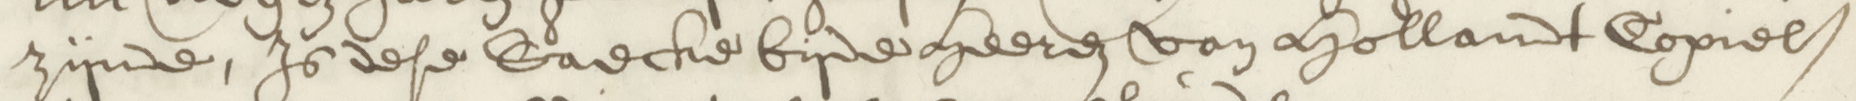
zijnde, Is dese Saecke bijde Heeren van Hollandt Copiel
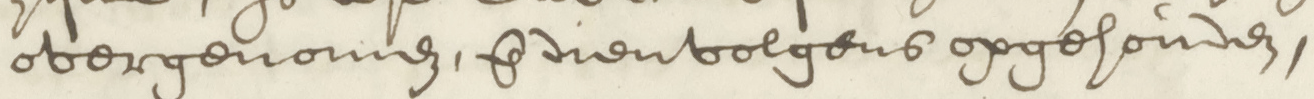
overgenomen, & dienvolgens opgehouden.
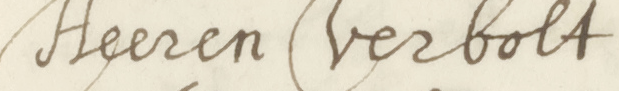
Heeren Verbolt
